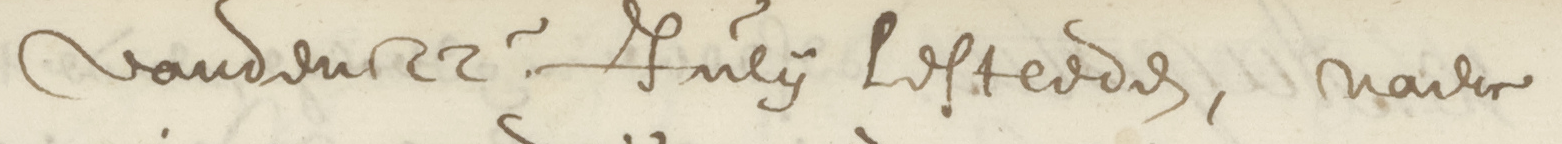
vanden 22e. Julij lestleden, naer
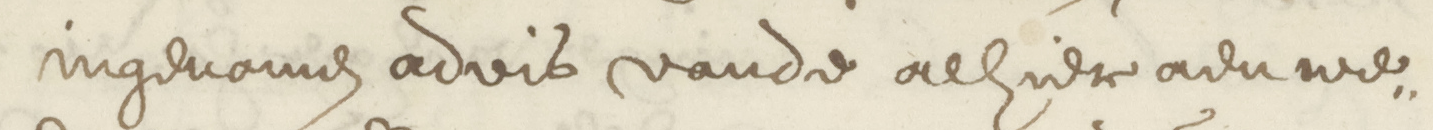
ingenomen advis vande alhier aenwe,,
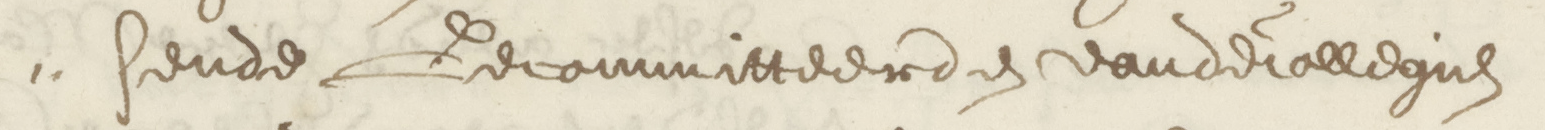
,,sende Gecommitteerden vande Collegien
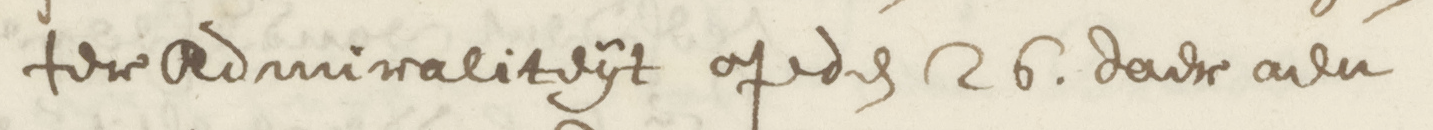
ter Admiraliteijt opden 26. daer aen
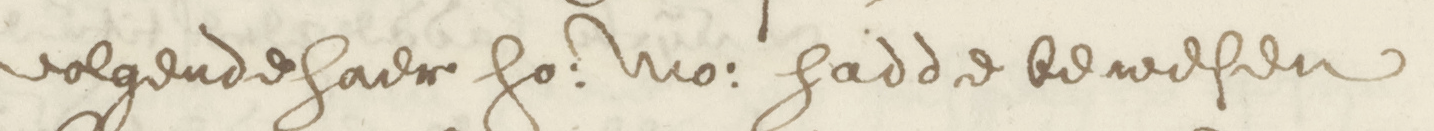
volgende haer ho:Mo: hadde bewesen
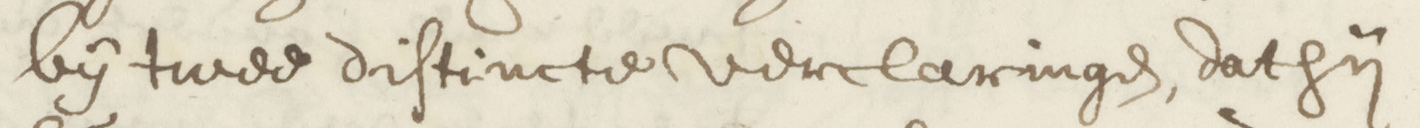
bij twee distincte verclaringen, dat hij
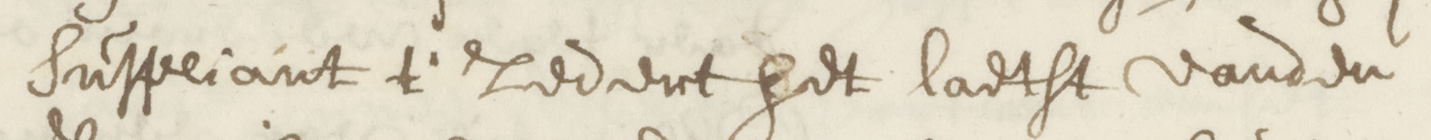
Suppliant t' Zedert het laetst vanden
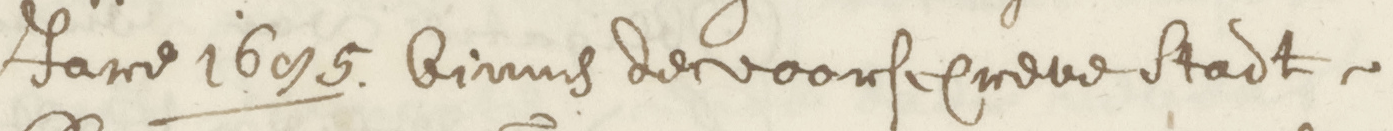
Jare 1685 binnen de voorschreve Stadt
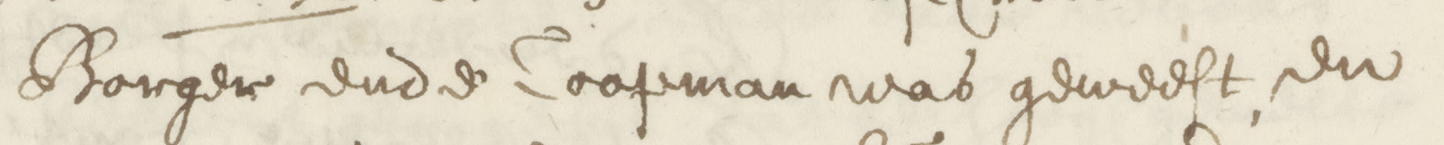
Borger ende Coopman was geweest en
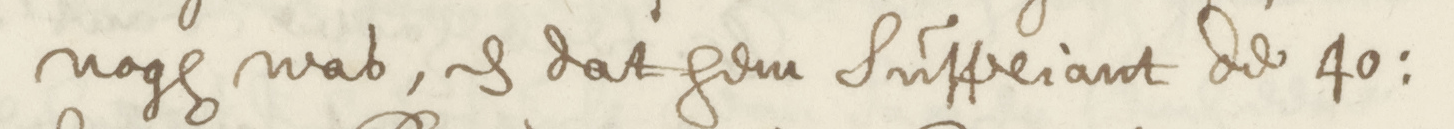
nogh was, & dat hem Suppliant de 40:
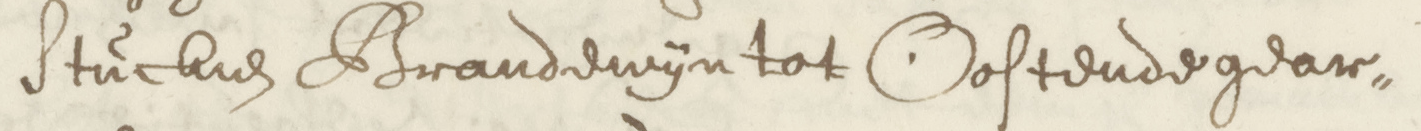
stucken Brandewijn tot Oostende gear„
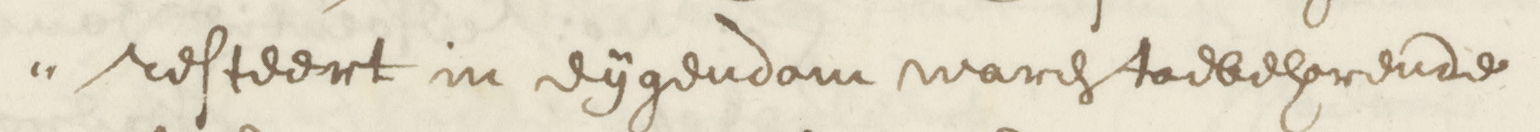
„resteert in eijgendam waren toebehorende
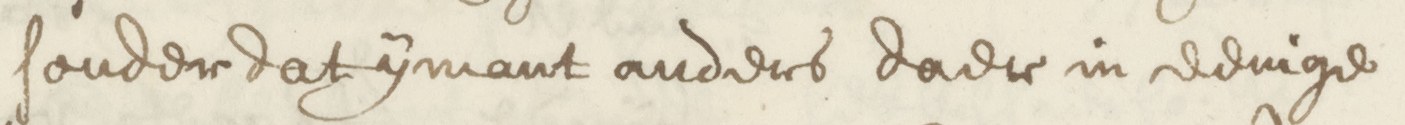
sonder dat ijmant anders daer in eenige
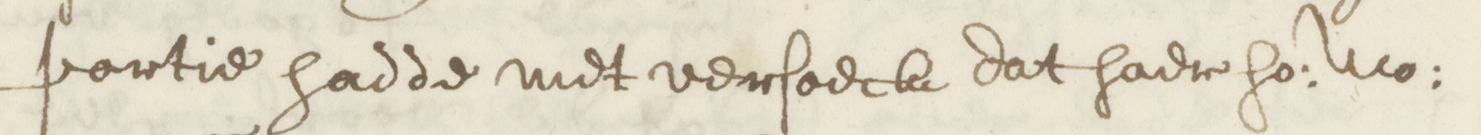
portie hadde met versoeck dat haer ho:Mo:
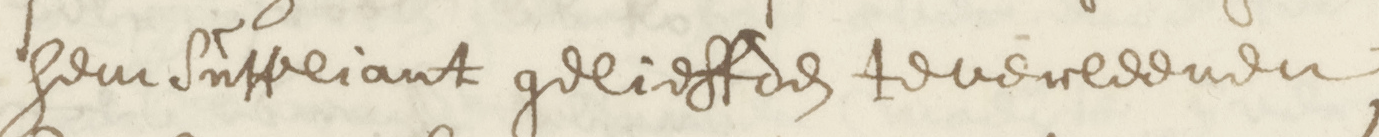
hem suppliant gelieffden te verleenen
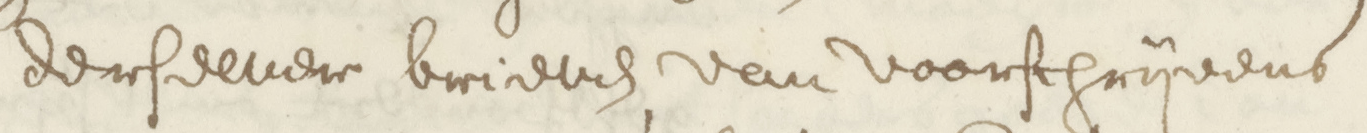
derselver brieven van voorschrijvens
